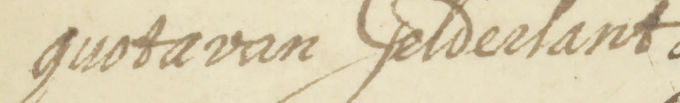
quota van Gelderlant,
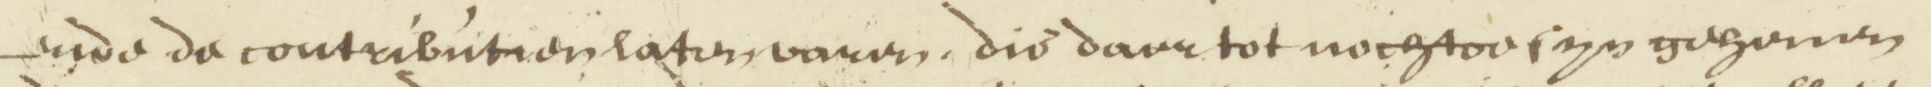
ende de contributien laten varen, die daer tot nochtoe syn geheuen
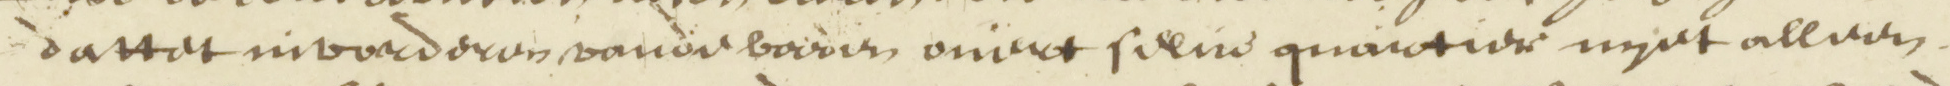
dattet invorderen vande beeden ouert selue quartier nyet alleen.
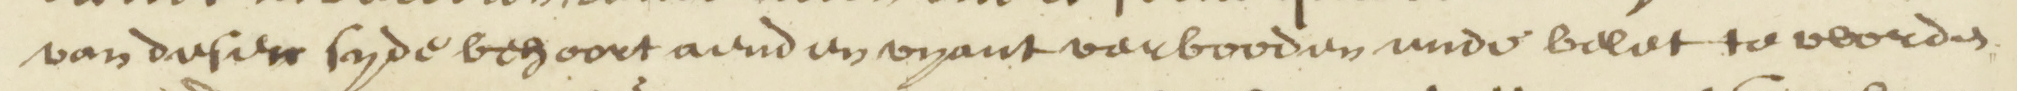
van deser syde behoort aenden vyant verbooden ende belet te worden,
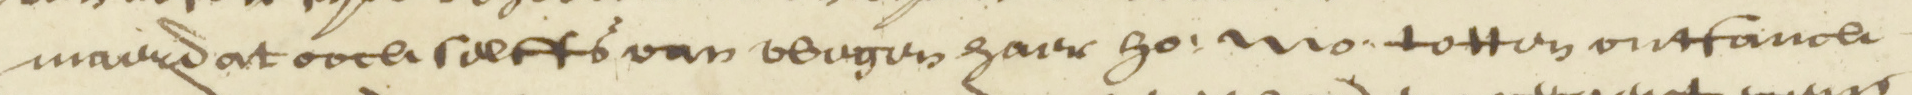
maer dat oock selffs van wegen haer ho:Mo: totten ontfanck
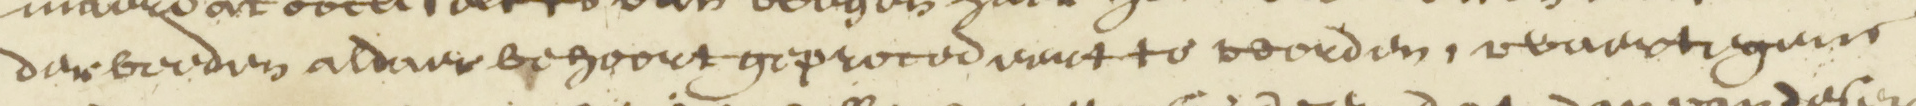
der beeden aldaer behoort geprocedeert te worden, waertegens
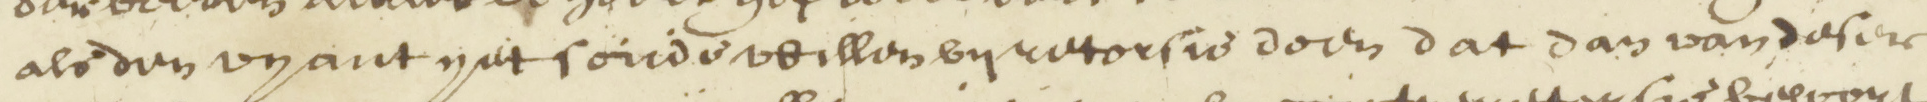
als den vyant yet soude willen by retorsie doen dat dan van deser
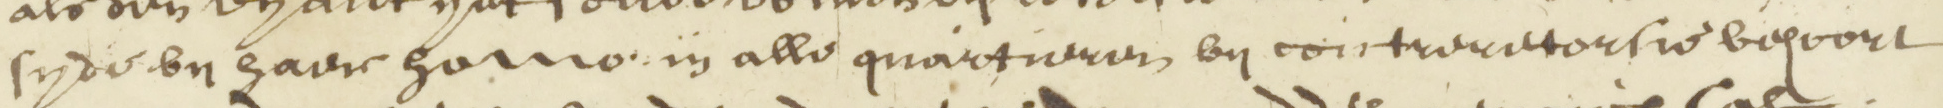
syde by haer hoMo: in alle quartieren by contreretorsie behoort
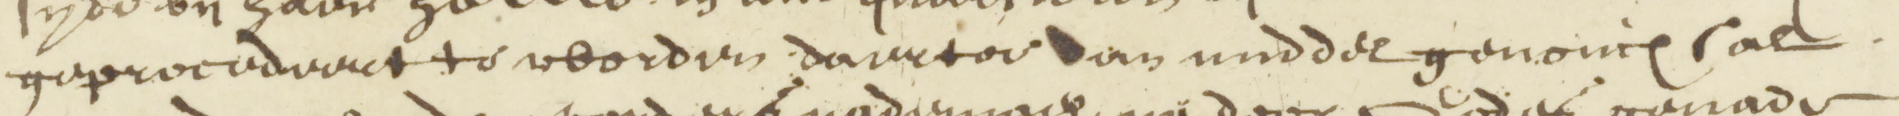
geprocedeert te worden daertoe dan middel genouch sal
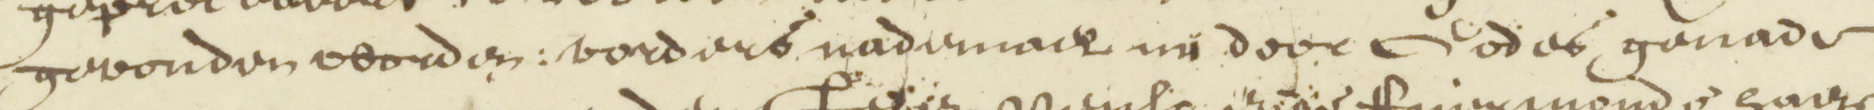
gevonden worden: vorders nademael nu door Godes genade
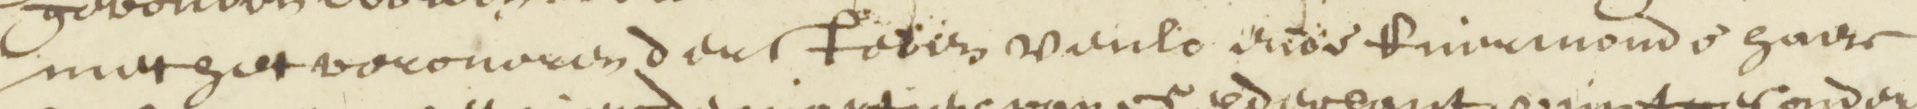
met het veroueren der steden Venlo ende Ruermonde haer
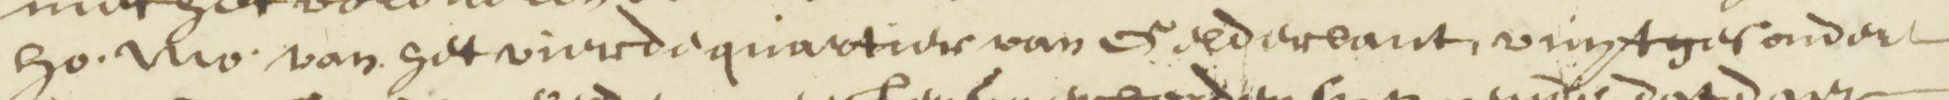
Ho:Mo: van het vierde quartier van Gelderlant, vuytgesondert
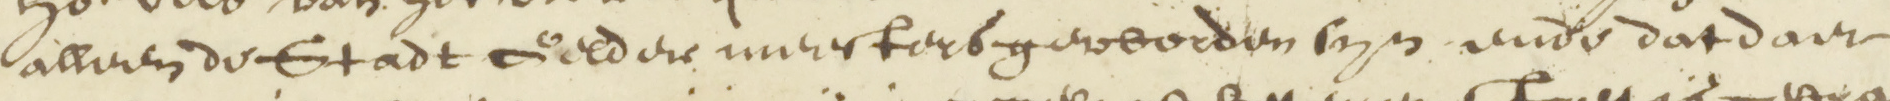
alleen de Stadt Gelder meesters geworden syn, ende dat daer
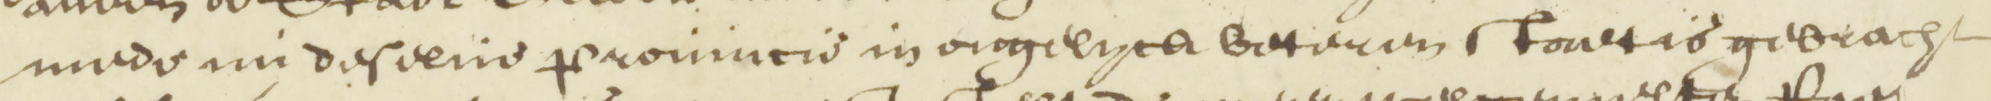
mede nu deselue prouincie in ongelyck beteren staet is gebracht
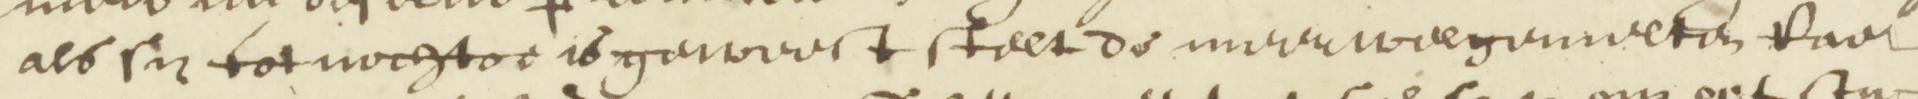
als sy tot nochtoe is geweest stelt de meerwelgemelten Raet
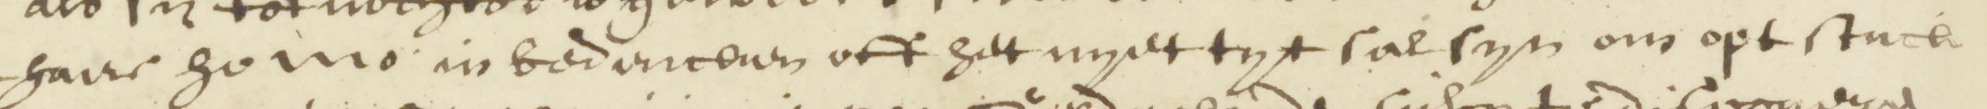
haer hoMo: in bedencken off het nyet tyt sal syn om opt stuck
